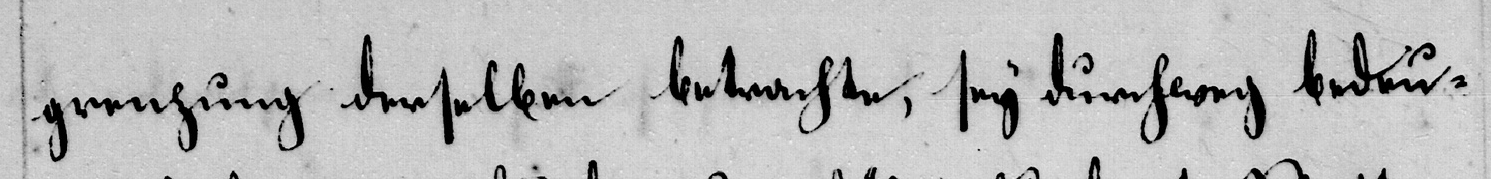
grenzung derselben betrachte, sey durchweg bedeu¬
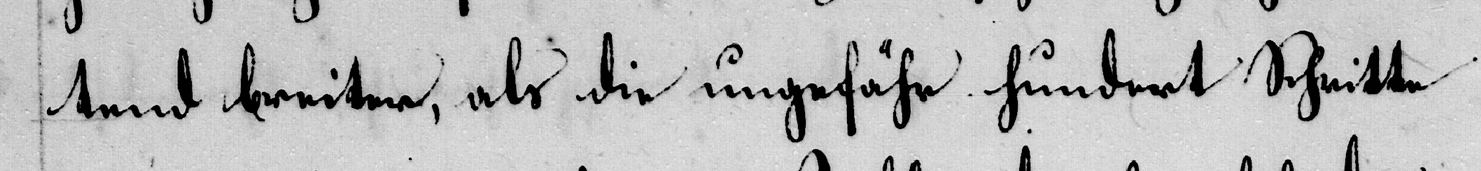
tend breiter, als die ungefähr hundert Schritte
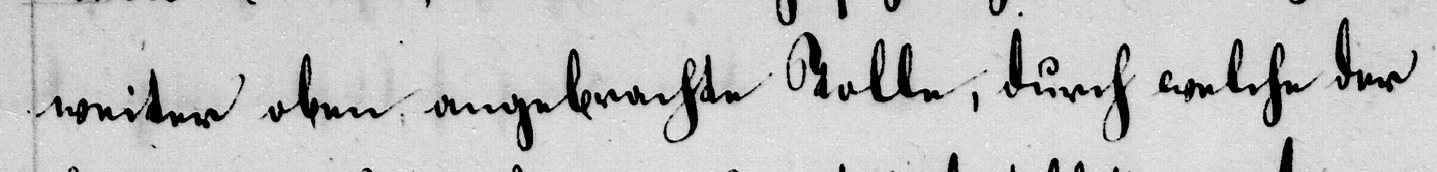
weiter oben angebrachte Tolle, durch welche der
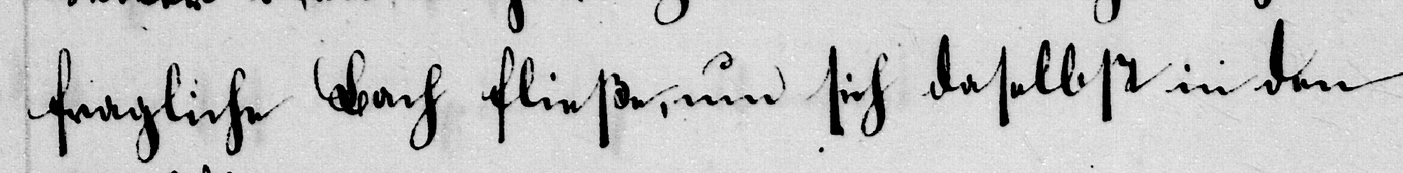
fragliche Bach fließe, um sich daselbst in den
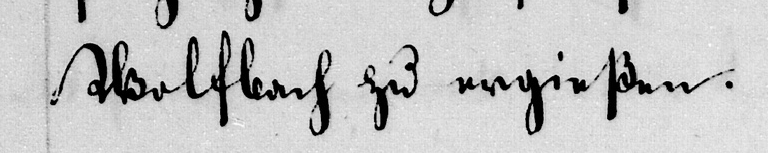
Wolfbach zu ergießen.
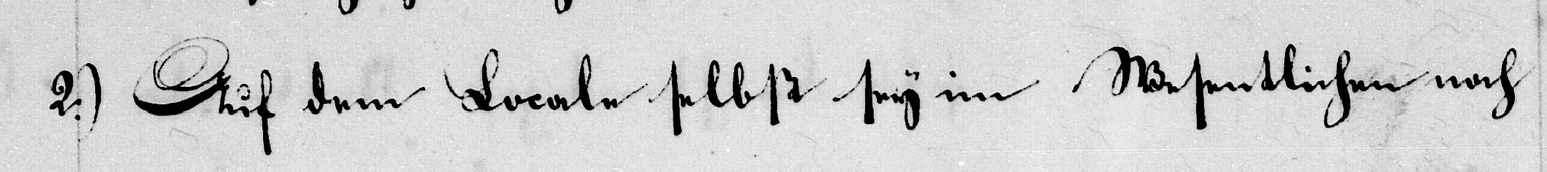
2.) Auf dem Locale selbst sey im Wesentlichen noch
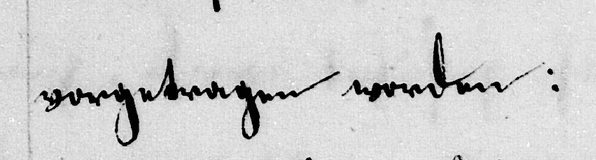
vorgetragen worden:
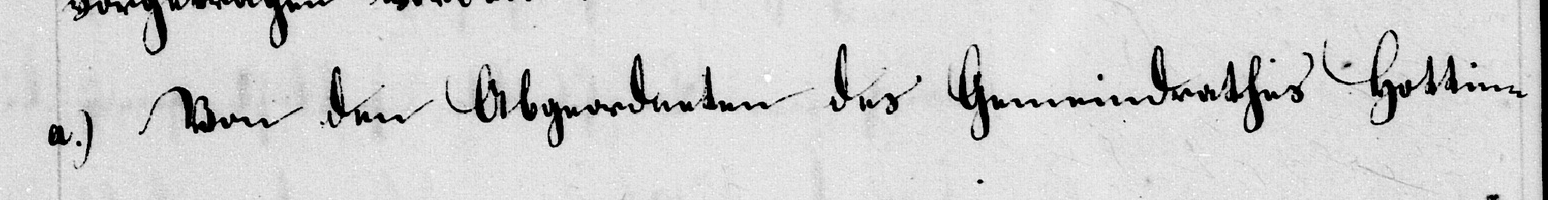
a.) Von den Abgeordneten des Gemeindrathes Hottin¬
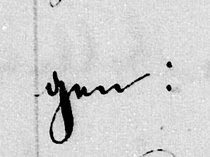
gen:
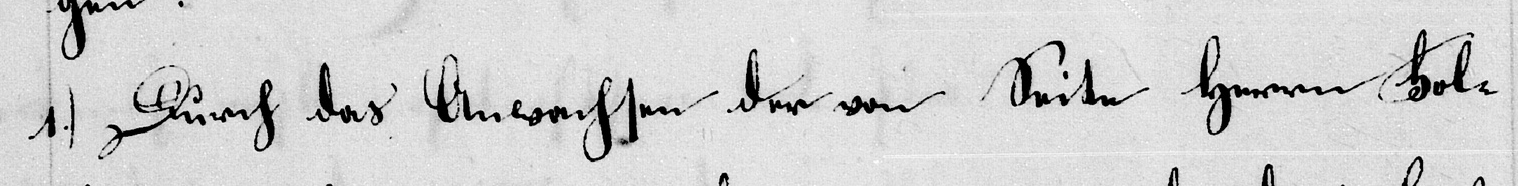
1.) Durch das Anwachsen der von Seite Herrn Fol¬
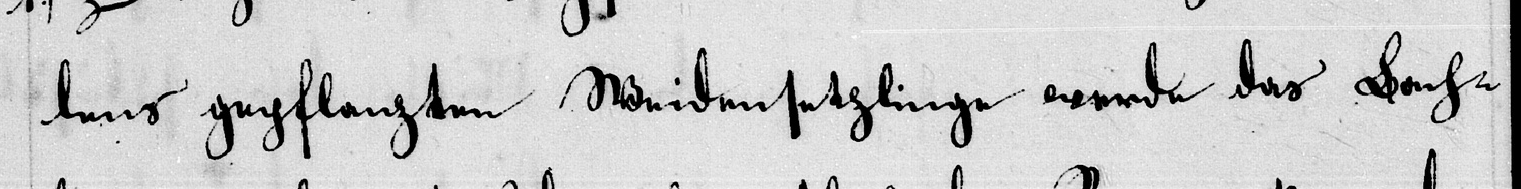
lens gepflanzten Weidensetzlinge werde das Bach¬
